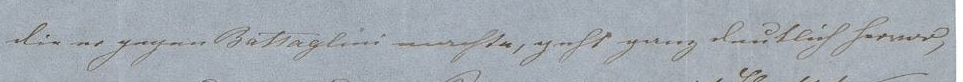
die er gegen Battaglini machte, geht ganz deutlich hervor,
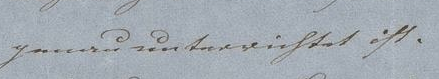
genau unterrichtet ist.
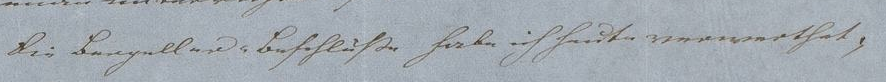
Die Bergeller-Beschlüße habe ich heute verwerthet,
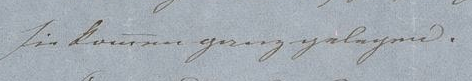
sie kommen ganz gelegen.
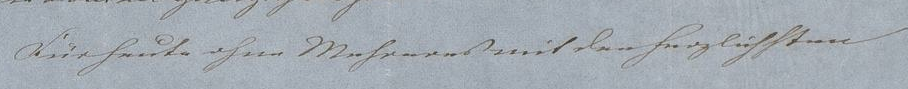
Für heute ohne Mehreres mit den herzlichsten
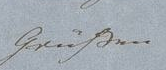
Grüßen
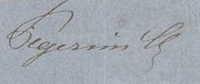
Peyer im Hof
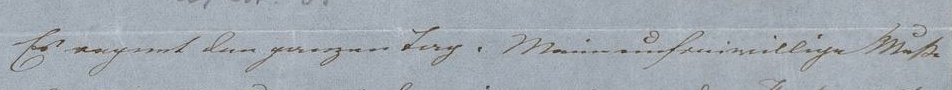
Es regnet den ganzen Tag. Meine unfreiwillige Muße
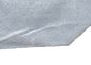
kommen.
